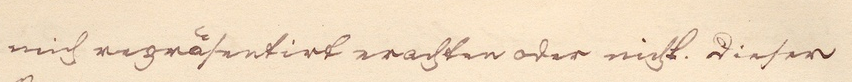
mich repräsentirt erachten oder nicht. Dieser
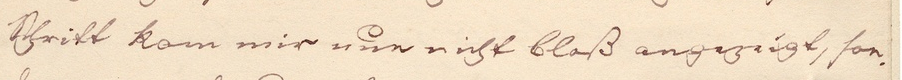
Schritt kam mir nun nicht bloß angezeigt, son-
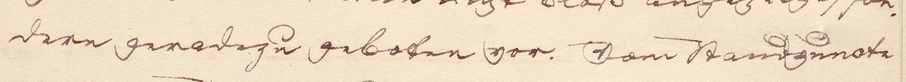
dern geradezu geboten vor. Vom Standpuncte
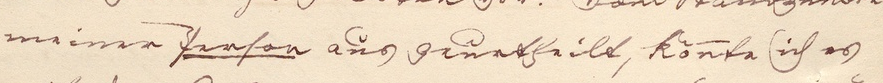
meiner Person aus geurtheilt, könnte ich es
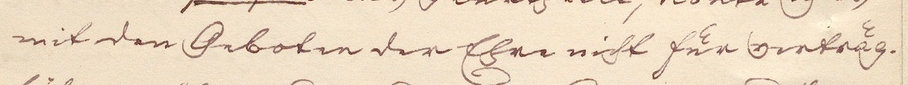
mit den Geboten der Ehre nicht für verträg-
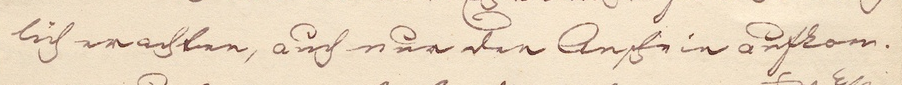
lich erachten, auch nur den Anschein aufkom-
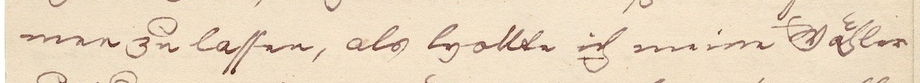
men zu lassen, als wollte ich meine Wähler
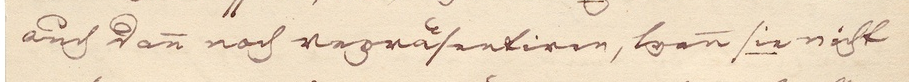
auch dann noch repräsentiren, wenn sie nicht
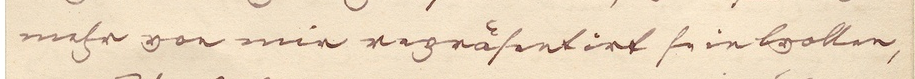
mehr von mir repräsentirt sein wollen,
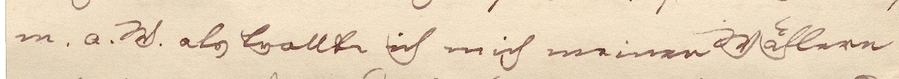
m. a. W. als wollte ich mich meinen Wählern
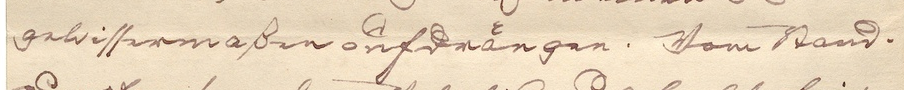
gewissermaßen aufdrängen. Vom Stand-
